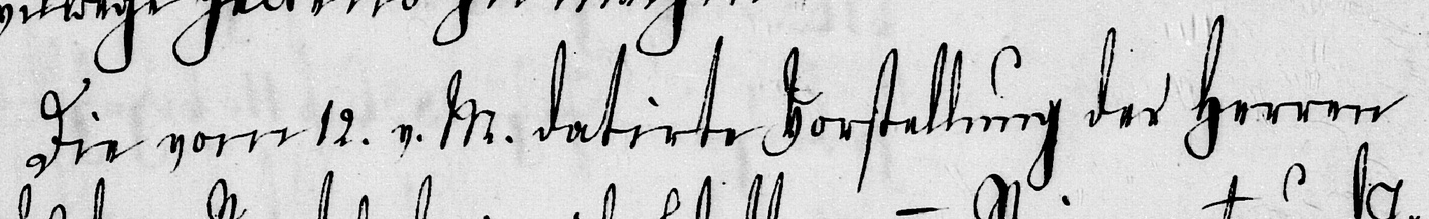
Die vom 12. d. M. datirte Vorstellung der Herren
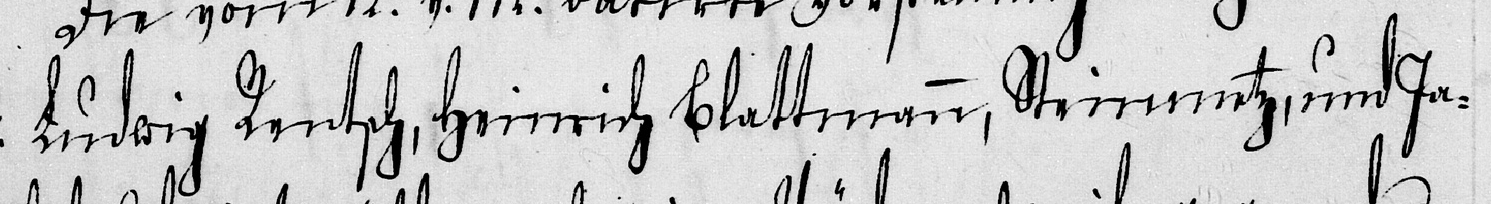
Ludwig Rentsch, Heinrich Blattmann, Steinmetz, und Ja¬
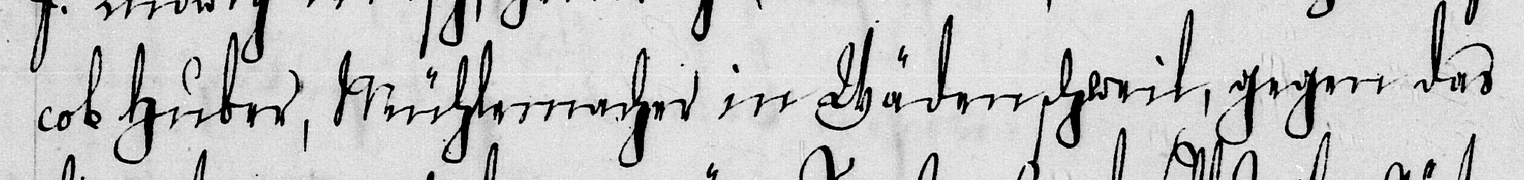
cob Huber, Mühlemacher in Wädenschweil, gegen das
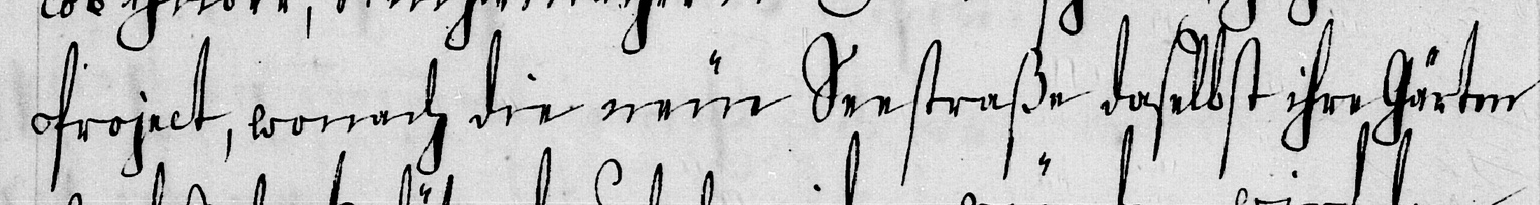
Project, wonach die neue Seestraße daselbst ihre Gärten
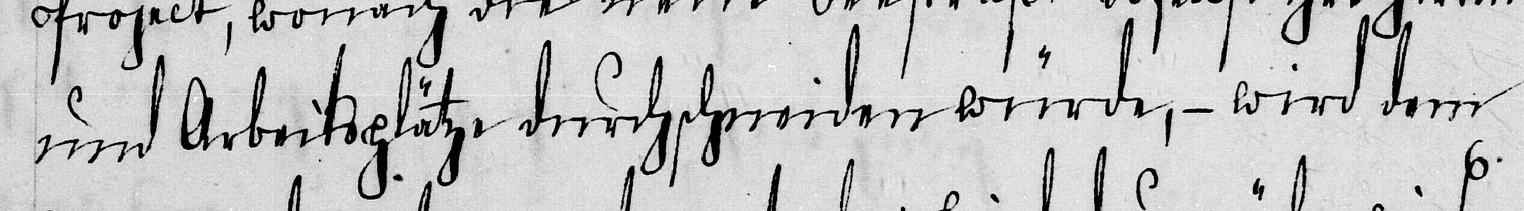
und Arbeitsplätze durchschneiden würde, – wird dem
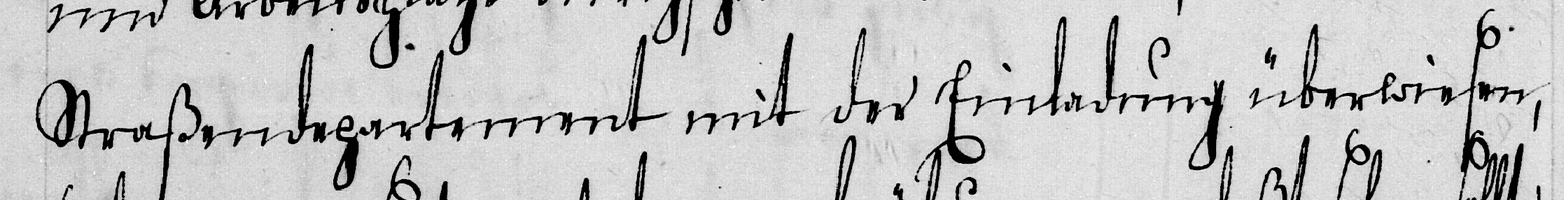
Straßendepartement mit der Einladung überwiesen,
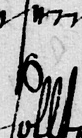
ßen.
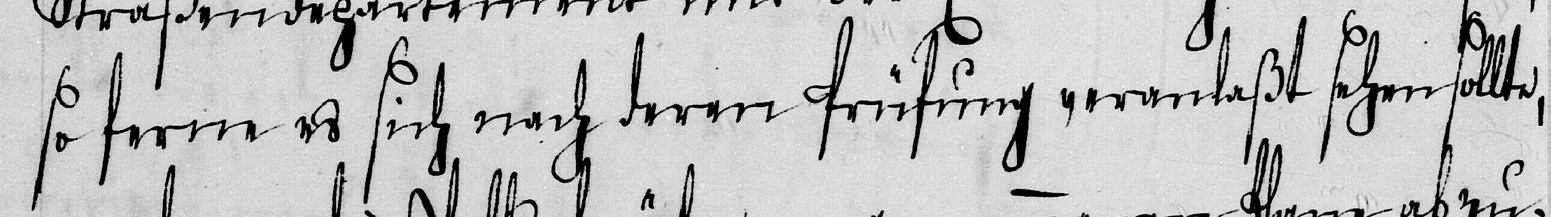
so ferne es sich nach deren Prüfung veranlaßt sehen soll¬
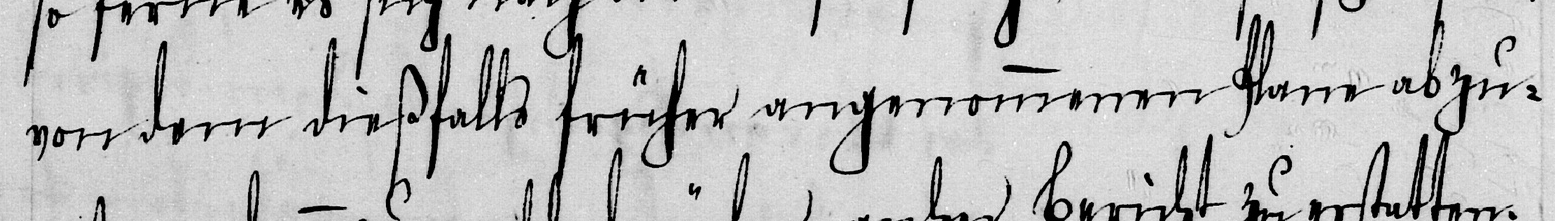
von dem dießfalls früher angenommenen Plan abzu¬
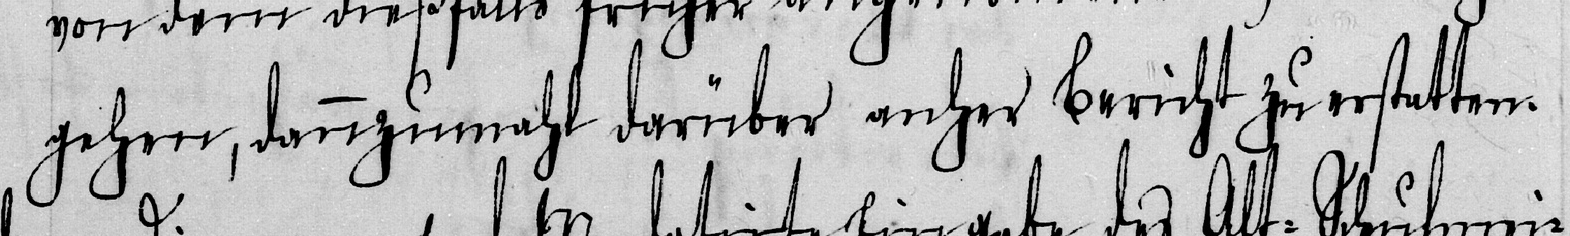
gehen, dannzumahl darüber anher Bericht zu erstatten.
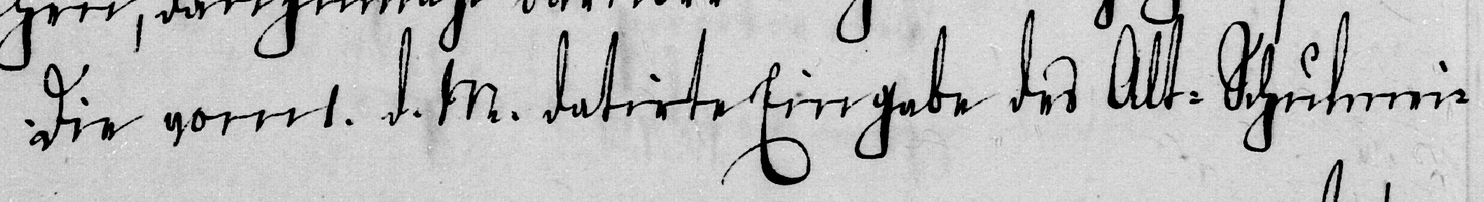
Die vom 1. d. M. datirte Eingabe des Alt-Schulmei¬
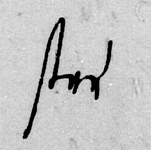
ster
